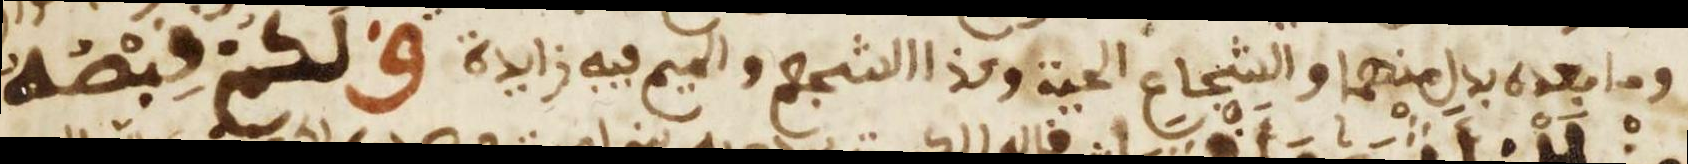و ما بعده بدل منهما و الشجاع الحية وكذا الشجعم و الميم فيه زايدة ق لكم قبصه
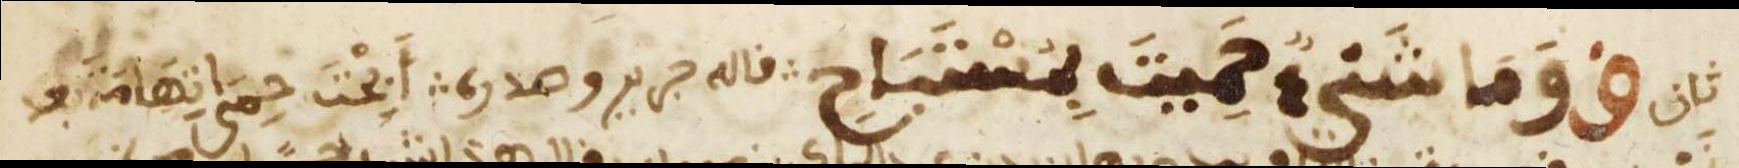ثان ق و ما شيء حميت بمستباح قاله جرير و صدره أبحت حمىٰ تهامة بعد
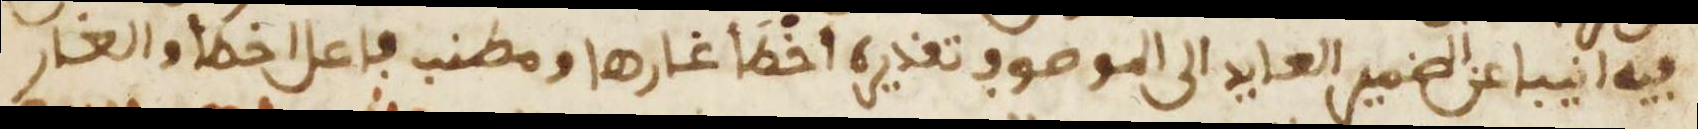فيه انيبا عن الضمير العايد الى الموصوف تقديره أخطأ غارها و مطنب فاعل اخطأ و الغار
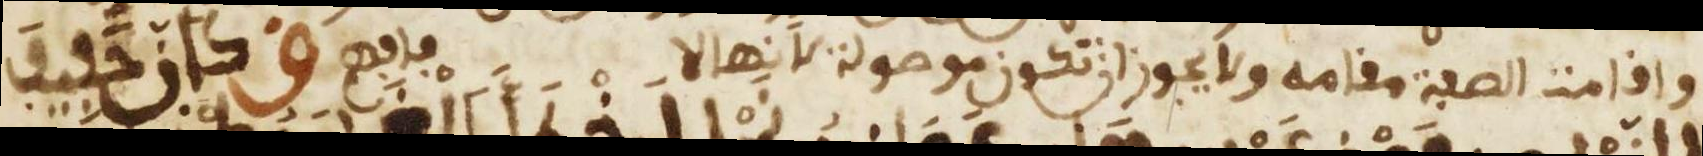و اقامت الصفة مقامه و لا يجوز ان تكون موصولة لانها لا فافهم ق كأن حفيف
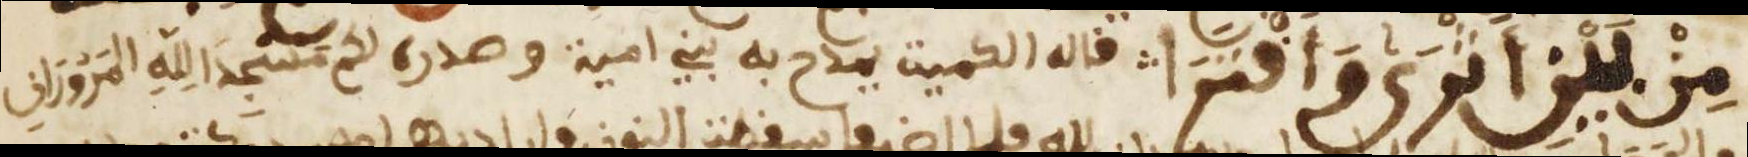من بين أثرى و أقترا قاله الكميت يمدح به بني امية، وصدره لكم مسجدا لله المروران
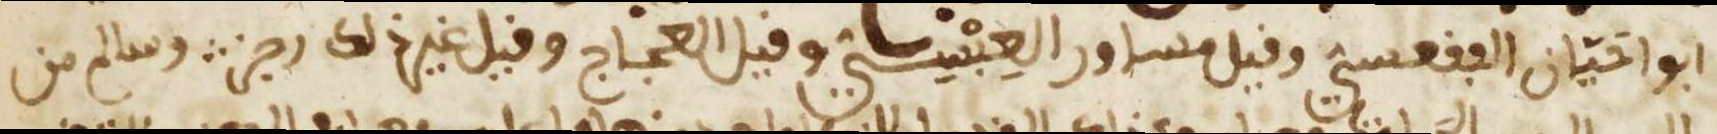ابوا حيان الفقعسي و قيل مساور العبسي و قيل العجاج و قيل غير ذلك رجز و سالم من
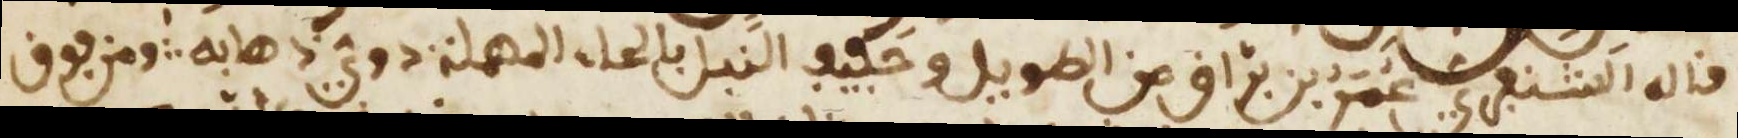قاله الشنفرى عمر بن براق من الطويل و حفيف النبل بالحاء المهملة دوي ذهابه و من فوق
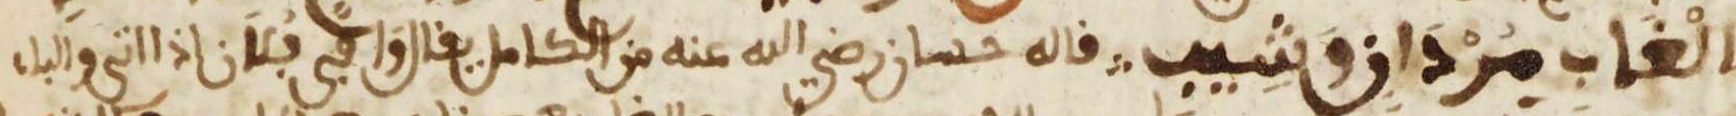الغاب مردان وشيب قاله حسان رضي الله عنه من الكامل يقال وافى فلان اذا اتى و الباء
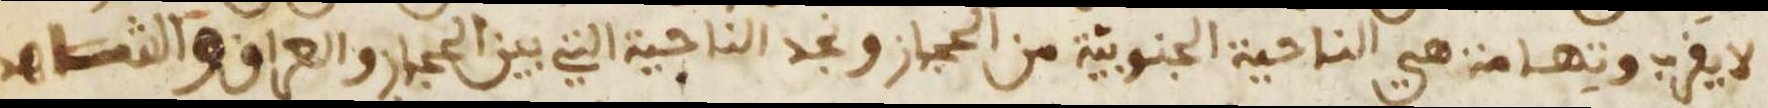لا يقرب و تهامة هي الناحية الجنوبية من الحجاز و نجد الناحية التي بين الحجاز و العراق و الشاهد
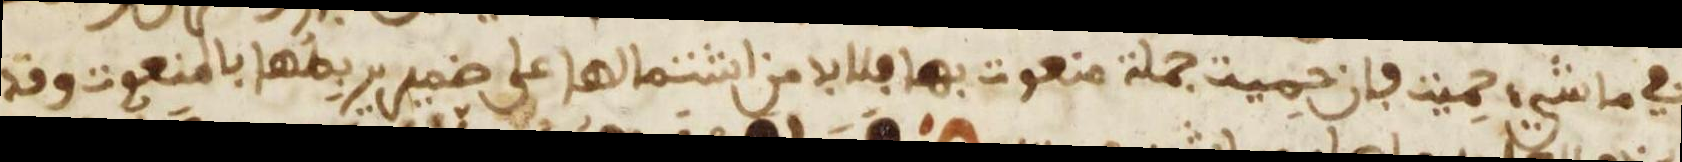في ما شيء حميت فان حميت جملة منعوت بها فلابد من اشتمالها على ضمير يربطها بالمنعوت و قد
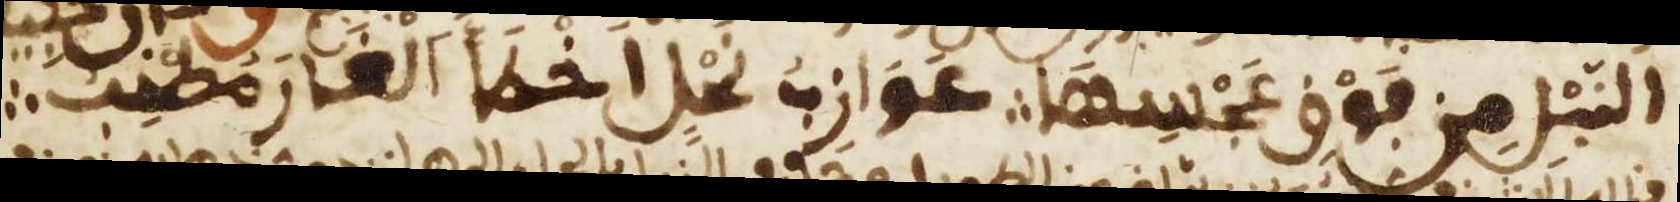النبل من فوق عجسها عوازب نحل اخطأ الغار مطنب
